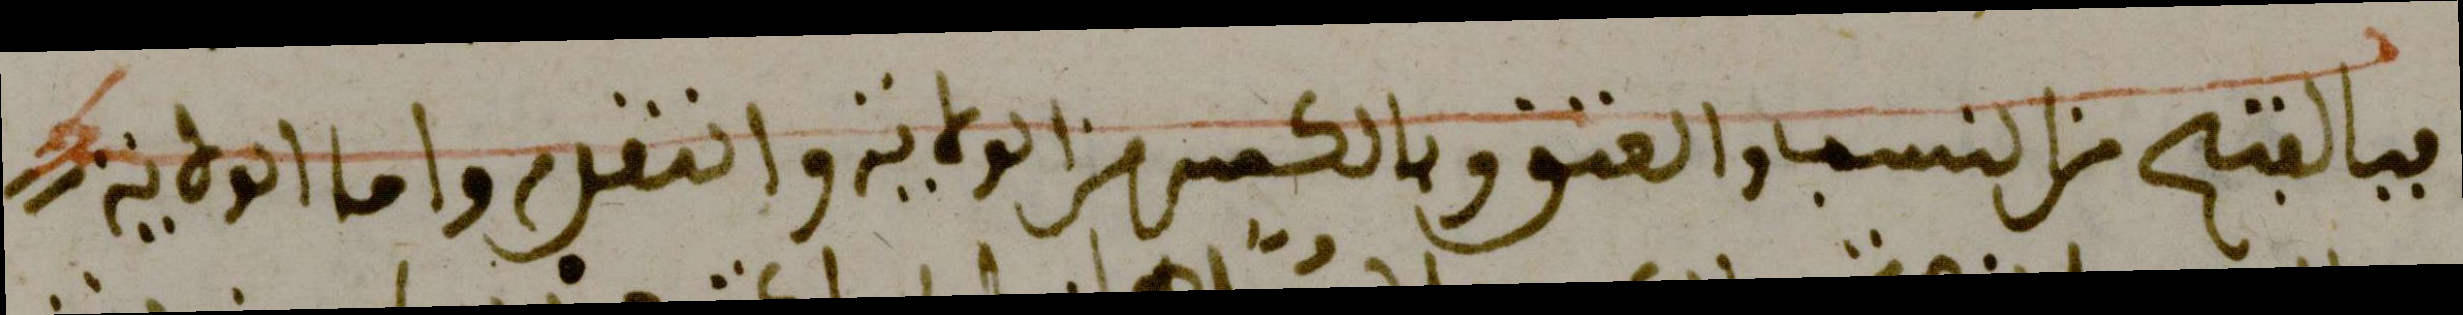فبالفتح من النسب والعتق بالكسر من الولاية والتقدم واما الولاية
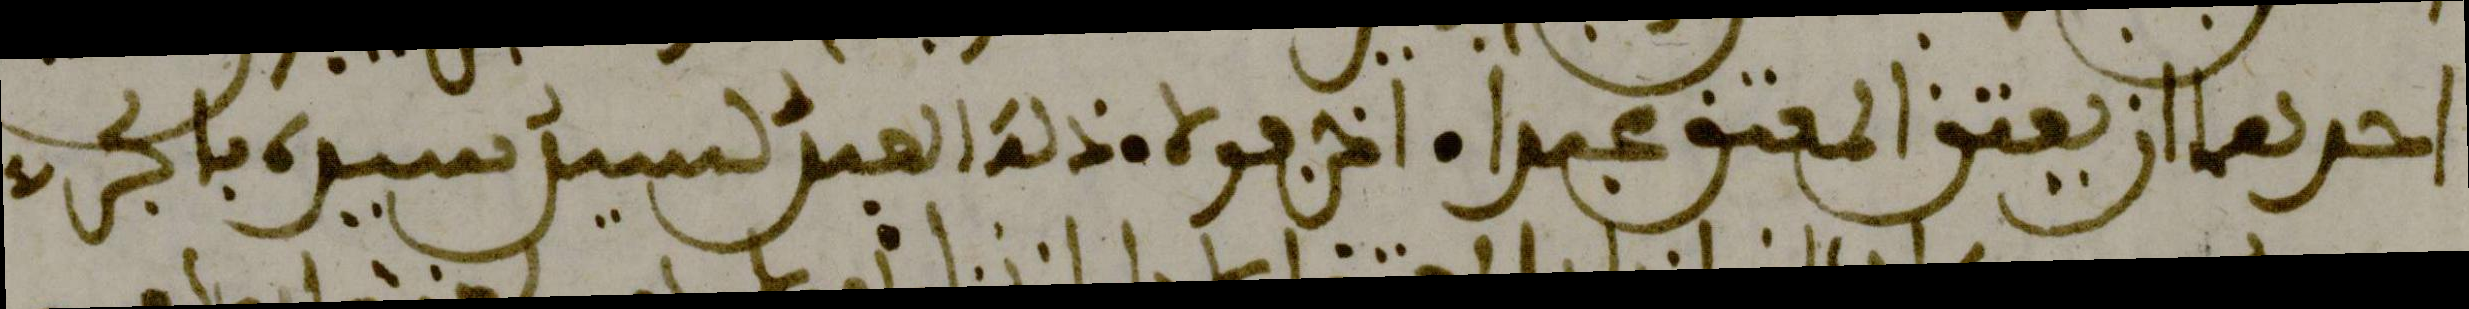احدهما ان يعتق المعتق عبدا ءاخر فولاء ذلك العب لسيد سيده بالجر
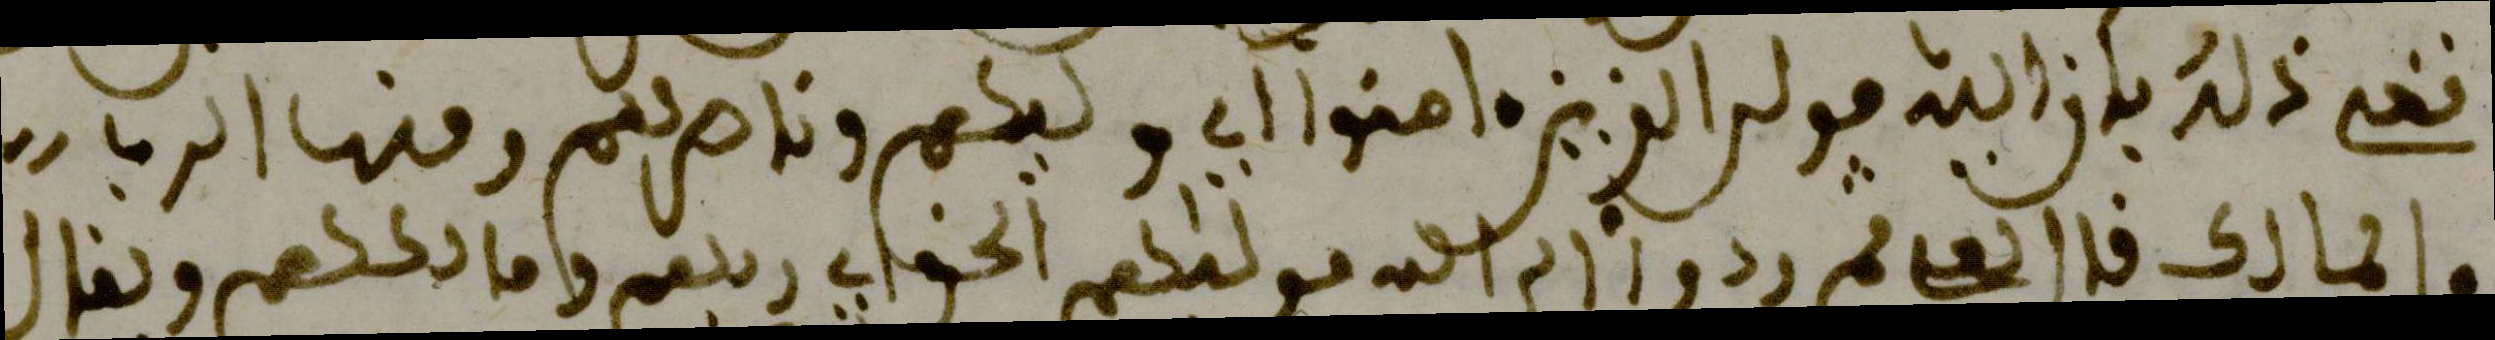تعلى ذلك بان الله مولى الذين ءامنوا اي ووليهم وناصرهم ومنها الرب
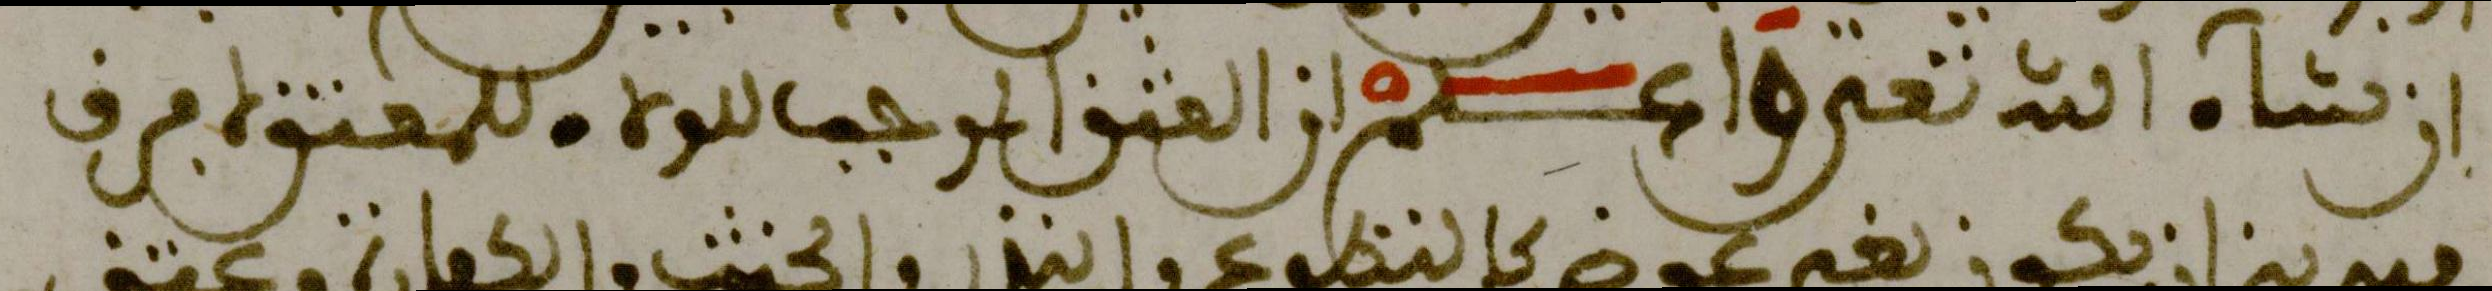ان شاء الله تعلى وَاعلم ان العتق الموجب للولاء للمعتق لا فرق
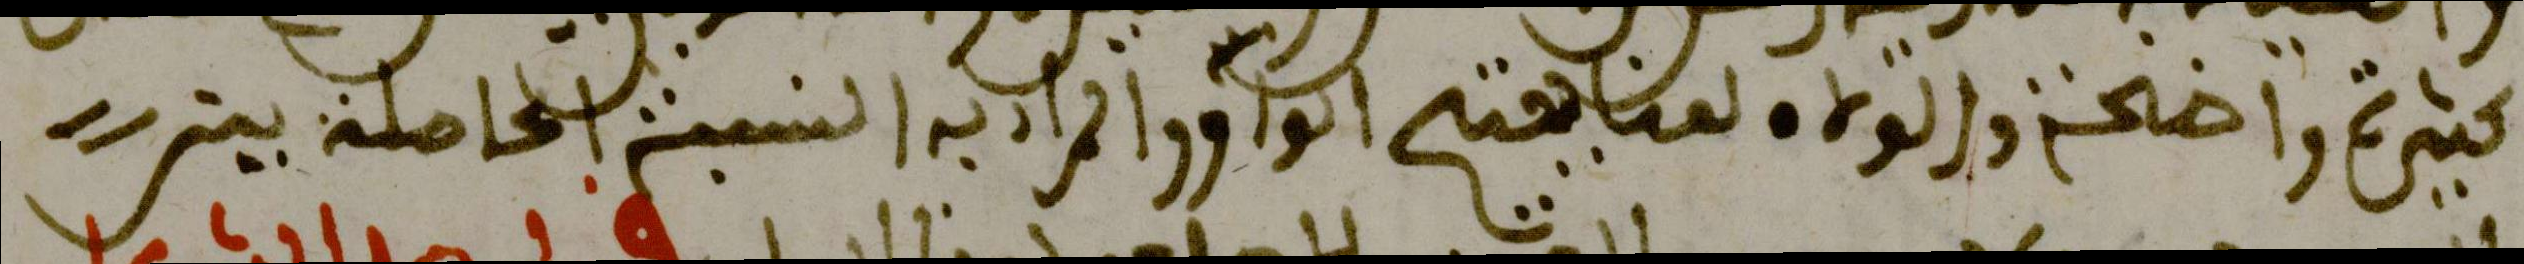كثيرة واضحة والولاء هنا بفتح الواو والمراد به النسبة الحاصلة بين
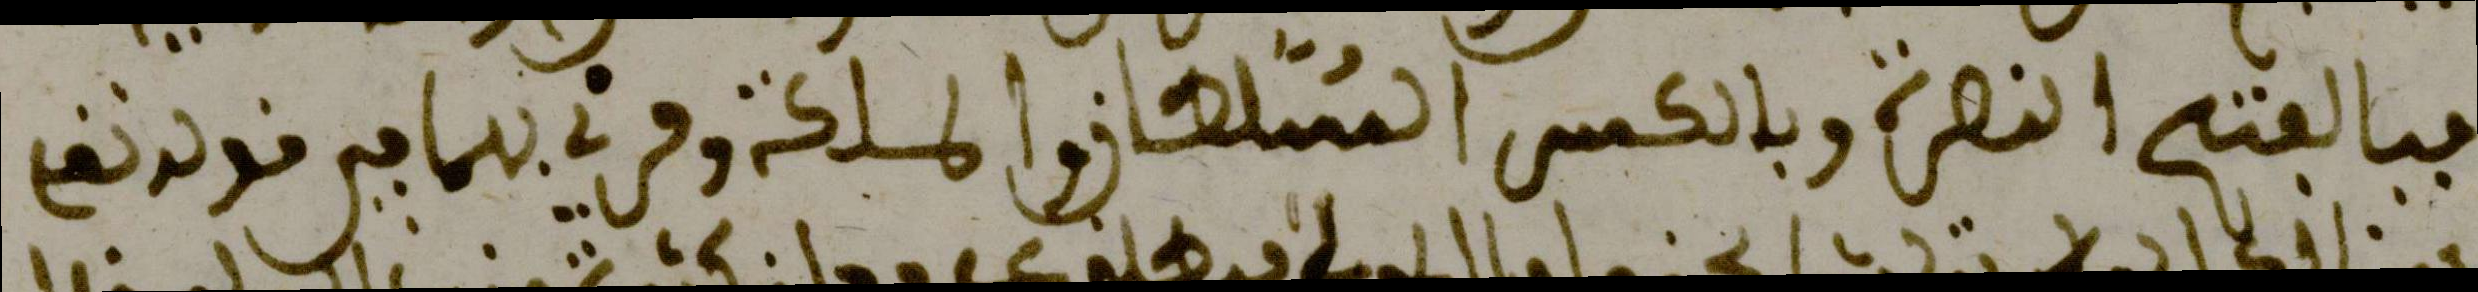فبالفتح النصرة وبالكسر السُلطان والملكة وقرئ بهما في قوله تعلى
